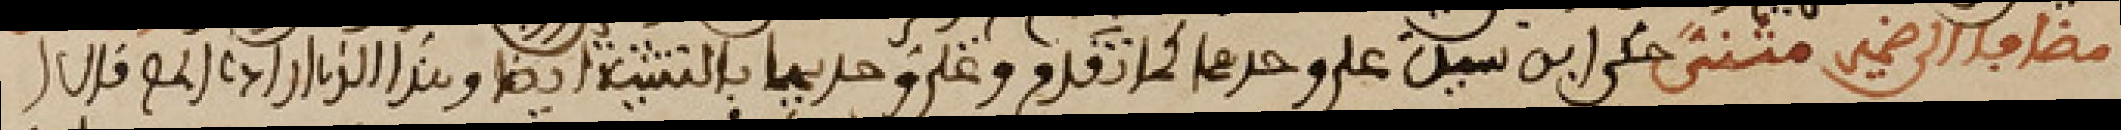مضاف الى ضمير مثنى حكى ابن سيد على و حدههما كما تقدم و على وحدهما بالتشبيه ايضا وهذا الذ اراد المع قال ل
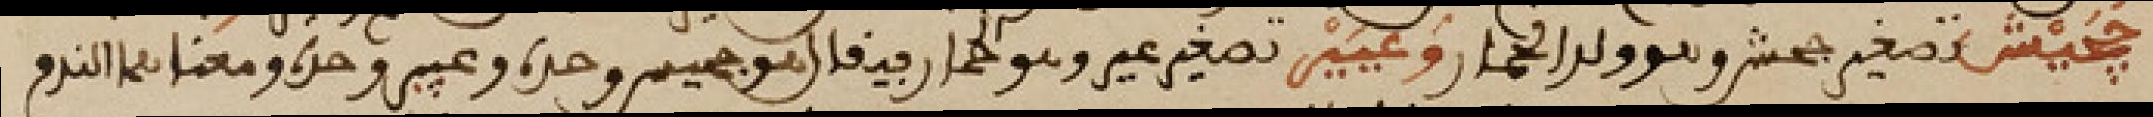جحيش تصغير جحش وهو ولد الحمار وعيير وهو تصغير عير فيقال هو جحيش وحده وعيير وحده ومعناها الندم
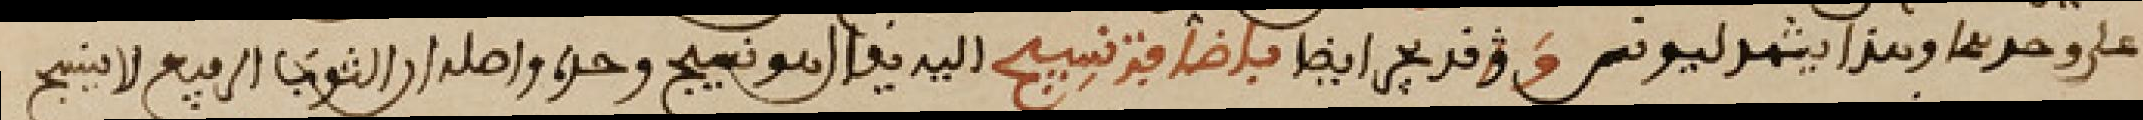على وحدها وهذا شهر ليونس و يجر ايضا باضافة نسيج اليد يقال هو نسيج وحده اصله ان الثوب الربيع لا نسيج
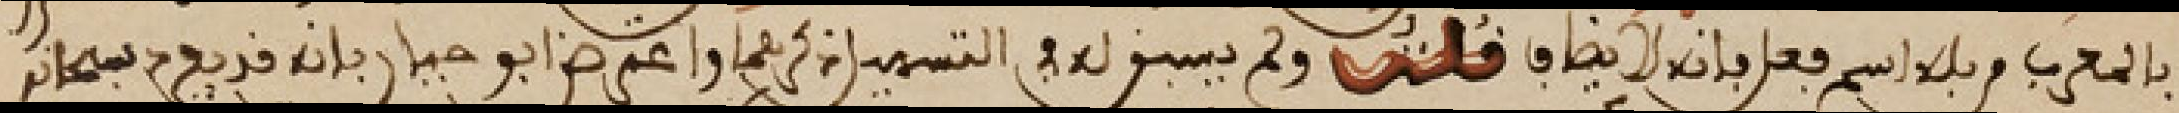بالمغرب من بلد اسم فعل فانه الايضاف قلت و لم يسبق له في التسهيل ذكرها و اعترض ابو حيان باه قد يرد سبحانه
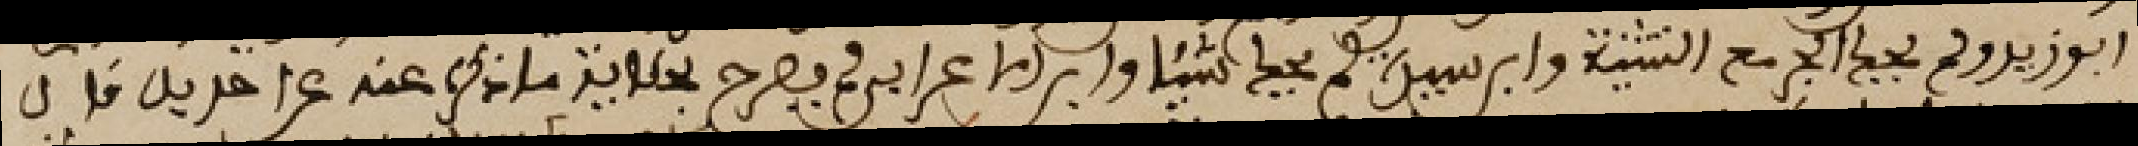ابو زيد لم يحك الجر مع التثنية وابن سيد لم يحك شيىا و ابن ابا اعرابي لم يصرح بحكاية ماذكر عنه عن احد يدخل ك
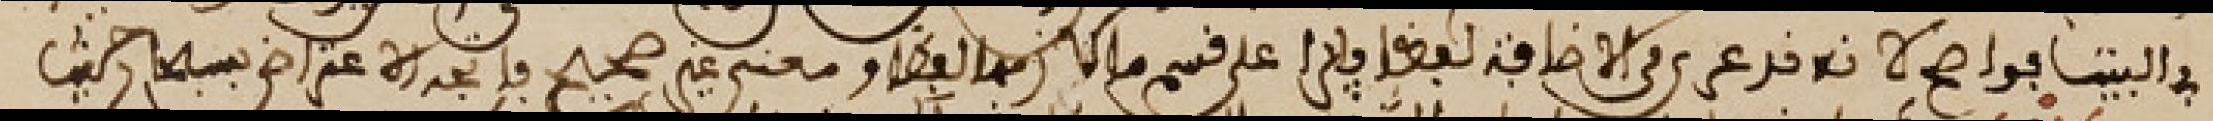في البيت بواضح لا نعثر عليه في الاضافة لفضا بالرد على قسم ما لا يلزمها لفضا و معنى غير صحصح فاتجد الاعتراض بسبحان حسث
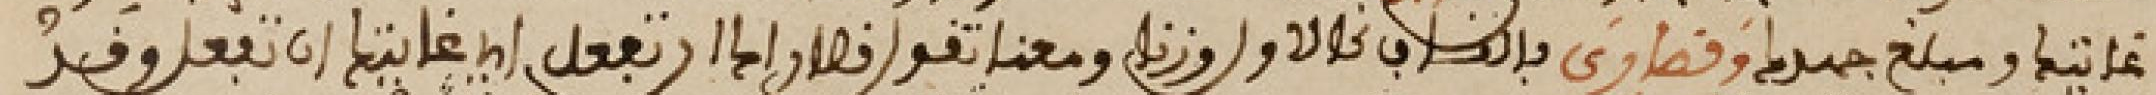غايتك و مبلغ جميلك و قصارى بالغاء كالاول و زنا و معنا تقول فعلا و ادار تفعل اي غايتك ان تفعل و قد
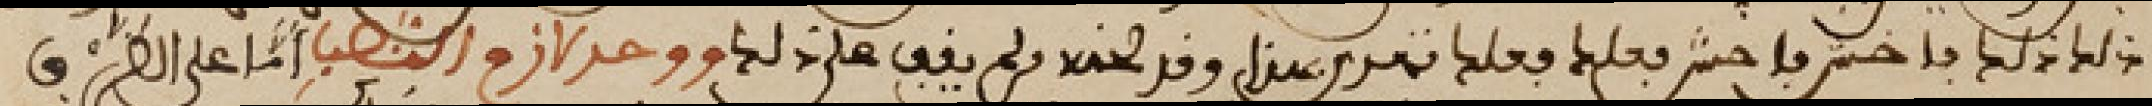ذلك ذلك يا حش يا حش فعلك فعلك تهدي هذا و قد تعند على يقف على ذلك ووحد لازم النصب اذا على الظرف
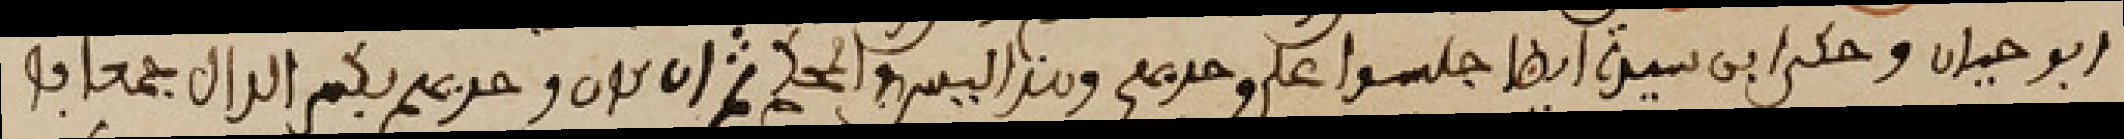فيابو حيان و حكى ابن سيد ايضا جلسوا على وحدهم و هذا ليس و المحكم ان كان وحدهم بكسر الدال جمعا
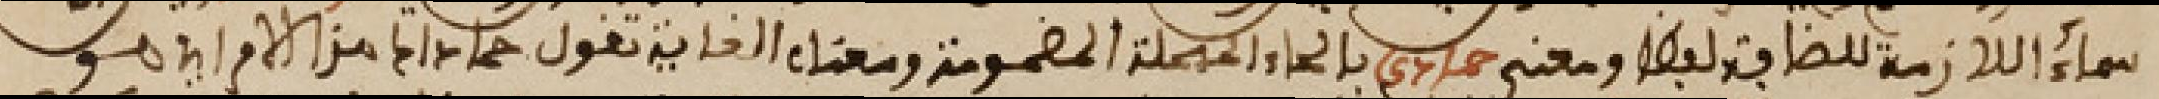سماء اللازمة للضافة لفظ و معتى جمادى بالحاء المبجلة المضمومة ومعناه الغاية تقول حمادا هذا الامر في هو
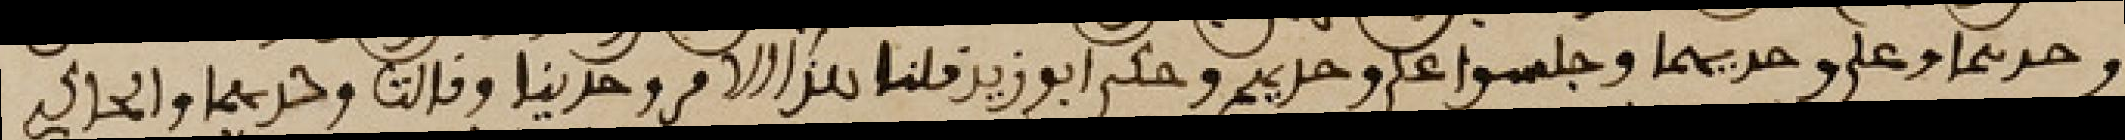وحدهما و على وحديهما و جلسوا على وحديهم و حكى ابو زيد قلنا هذا الامر وحدينا و قالت وحذيهما و الحاكم
